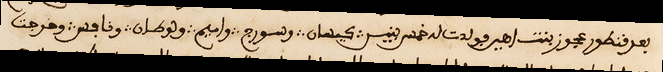بعد قنطور عجوز بنت اهين فولدت له خمس بنين كيسان وسورج واميم ولوطان ونافس وخرجت
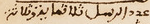عدد الرسل ثلاثماية وثلاثة
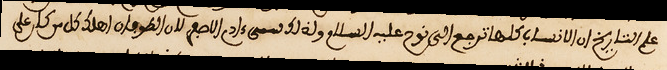علم التاريخ ان الانساب كلها ترجم الى نوح عليه السلام ولذلك سمى ءادم الاصفر لان الطو فان اهلك كل من كان على
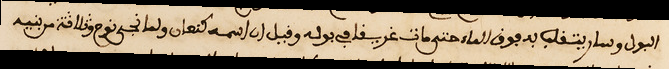البول وسار يتقلب بد فوق الماء حتى مات غريقا في بوله وقيل ان اسمه كنعان ولما نجى نوح وثلاثة من بنيه
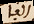الفا
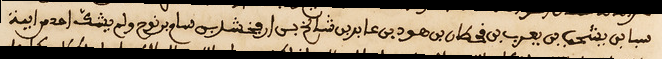سبا بن يشحف بن بعرب بن قحطان بن هود بن عابد بن شالخ بن ازفخشد سام بن نوح ولم يشك احد من ابيه
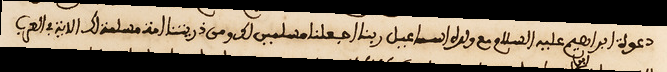دعوة ابراهيم عليه السلام مع ولده اسماعيل ربنا اجعلنا مسلمين لك ومن ذريتنا امة مسلمة لك الاية في العرب
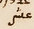عشر
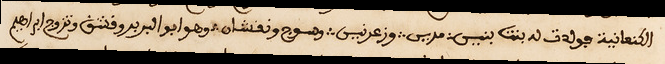الكنعانية فولدت له بنت بنين مدين وزعدين وسوج ونقشان وهو ابو البربر وقشق وتزوج ابراهيم
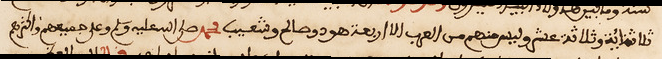ثلاثماية وثلاثة عشر وليس منهم من العرب الا اربعة هود وصالح وشعيب محمد صلى الله عليه وسلم وعلى جميعهم واكثرهم
